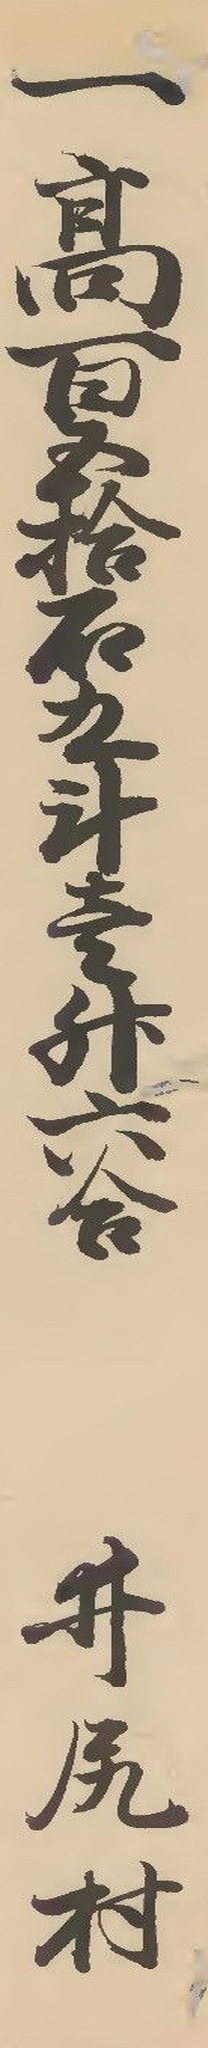一髙百五拾石九斗壱升六合井尻村
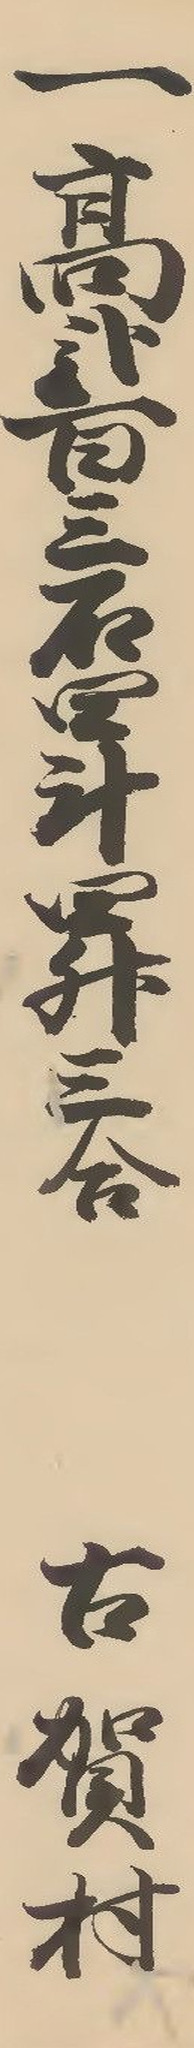一髙弐百三石四斗四升三合古賀村
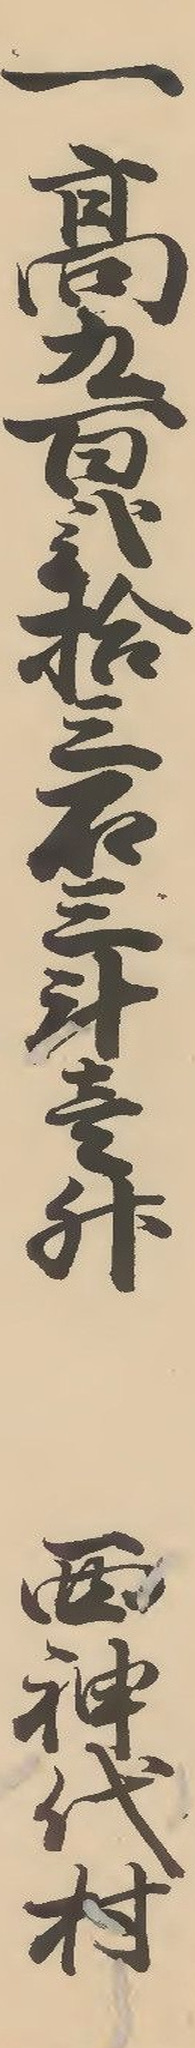一髙九百弐拾三石三斗壱升西神代村
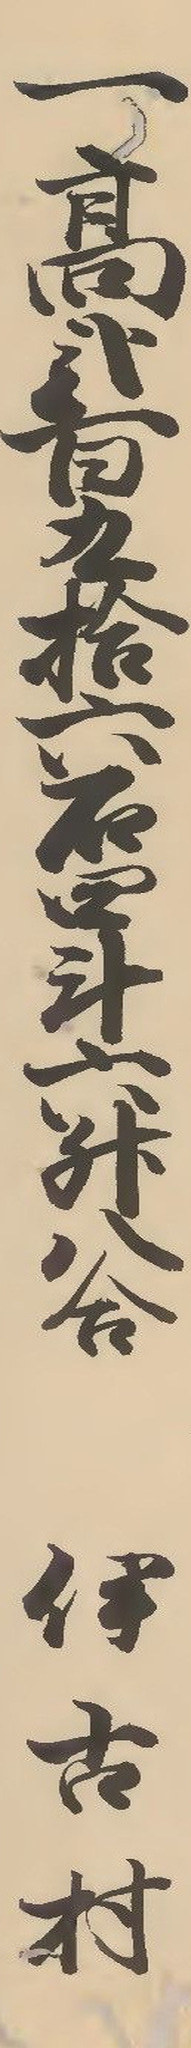一髙弐百九拾六石四斗六升八合伊古村
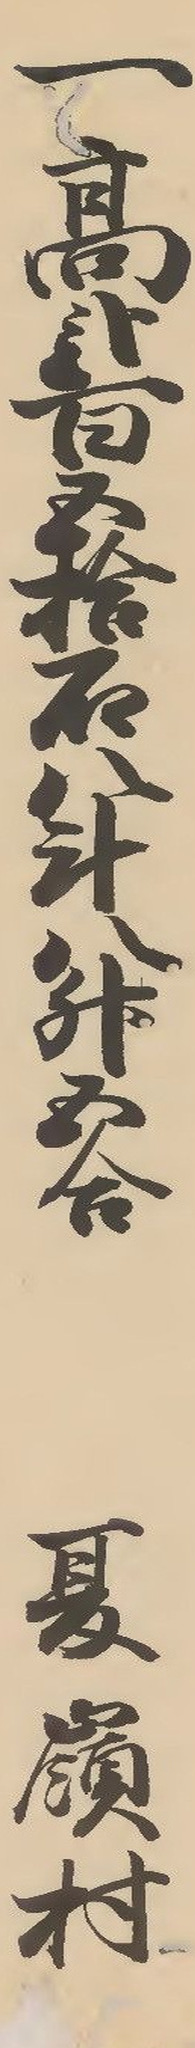一髙弐百五拾石八斗八升五合夏嶺村
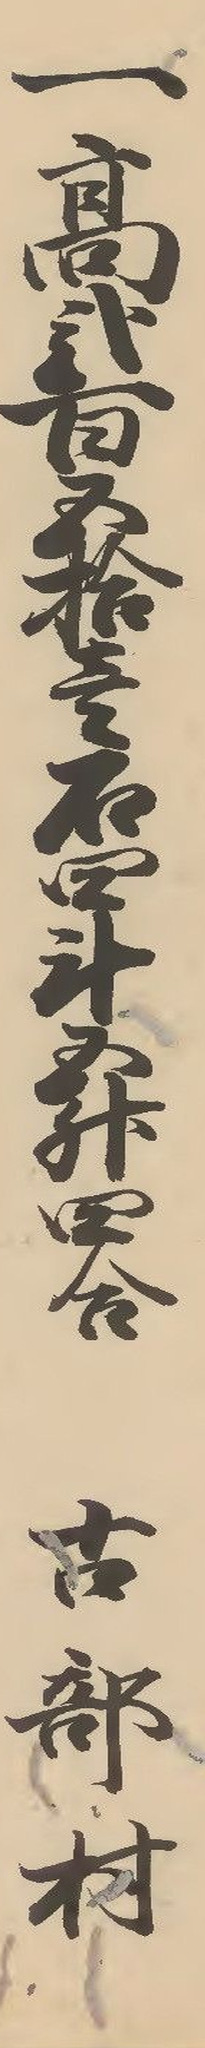一髙弐百五拾壱石四斗五升四合古部村
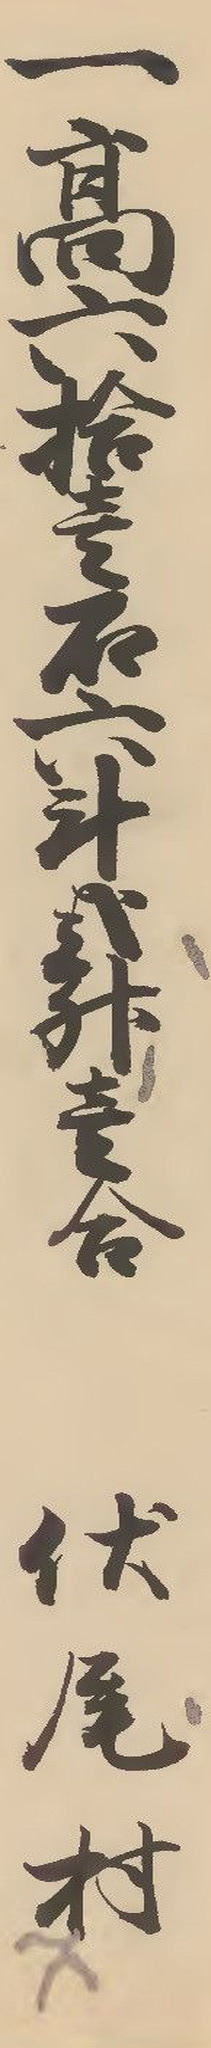一髙六拾壱石六斗弐升壱合伏尾村
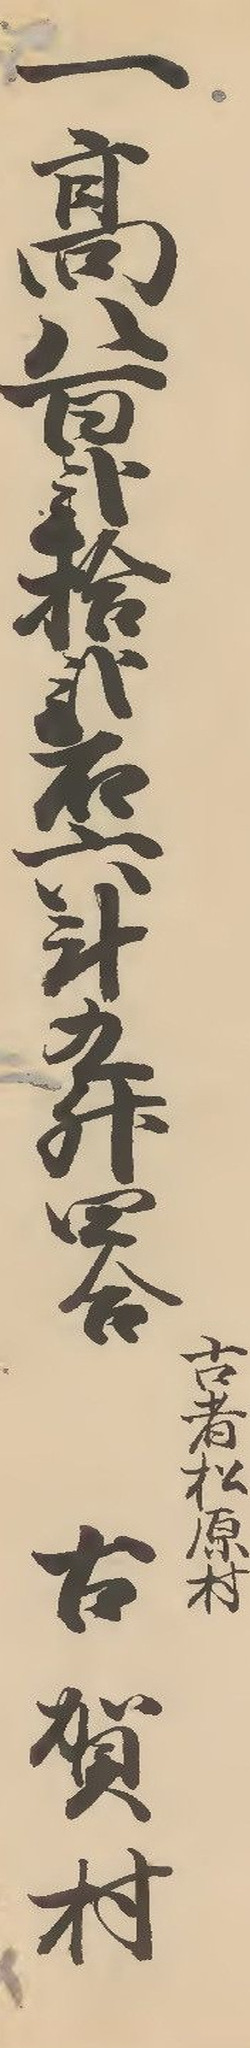一髙八百弐拾弐石六斗九升四合古賀村

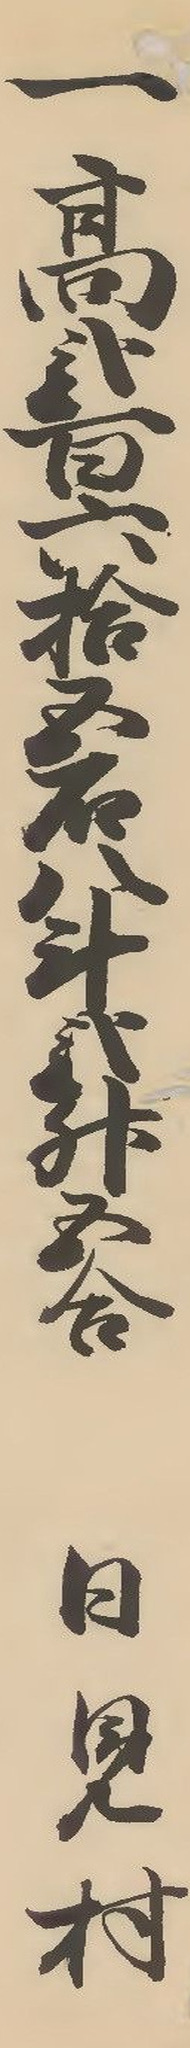一髙弐百六拾五石八斗弐升五合日見村
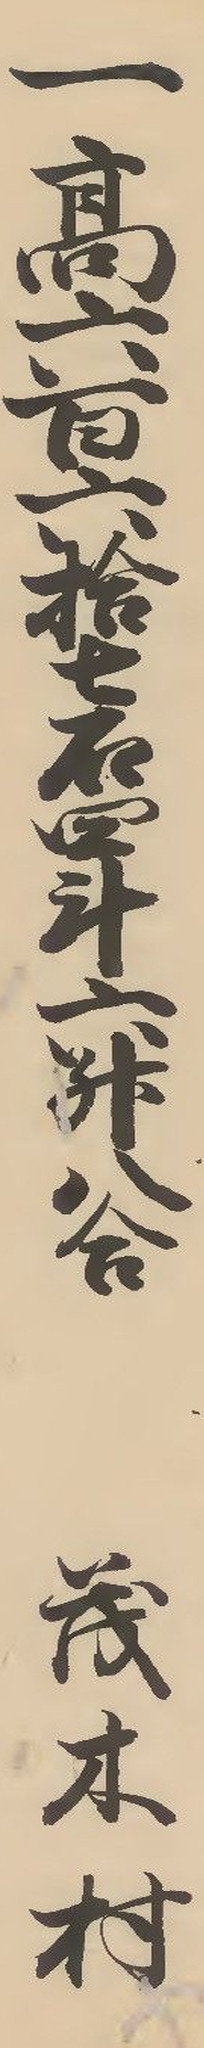一髙六百六拾七石四斗六升八合茂木村
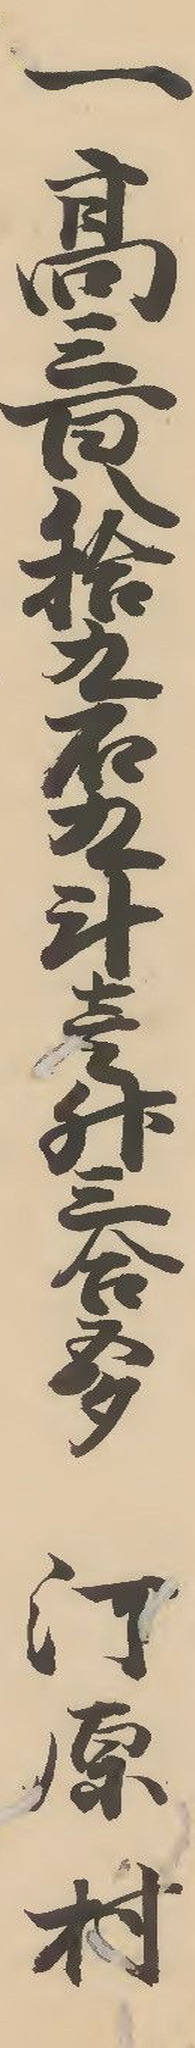一髙三百八拾九石九斗三升三合五夕河原村
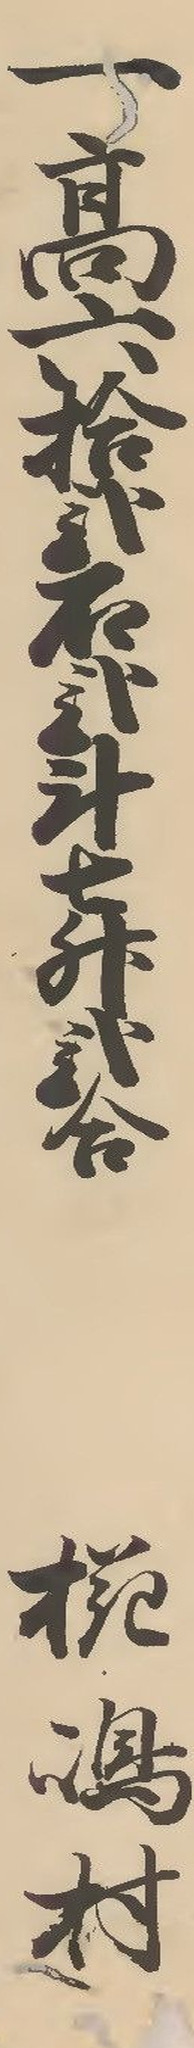一髙六拾弐石二斗七升弐合嶋村
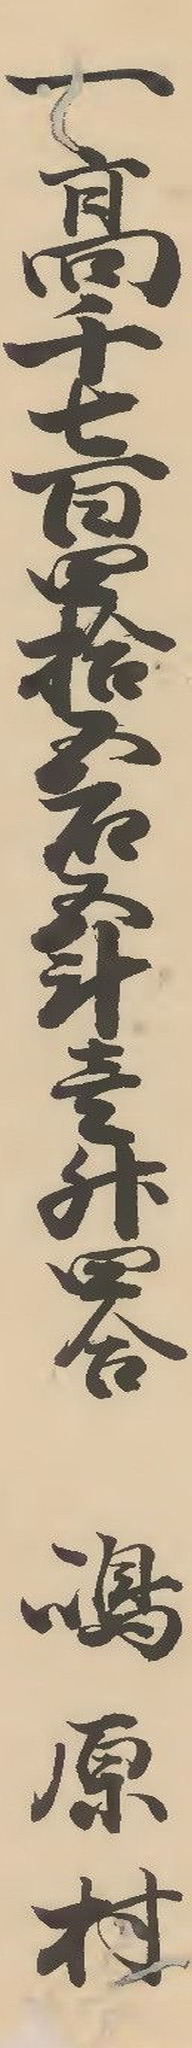一髙千七百四拾五石五斗壱升四合嶋原村
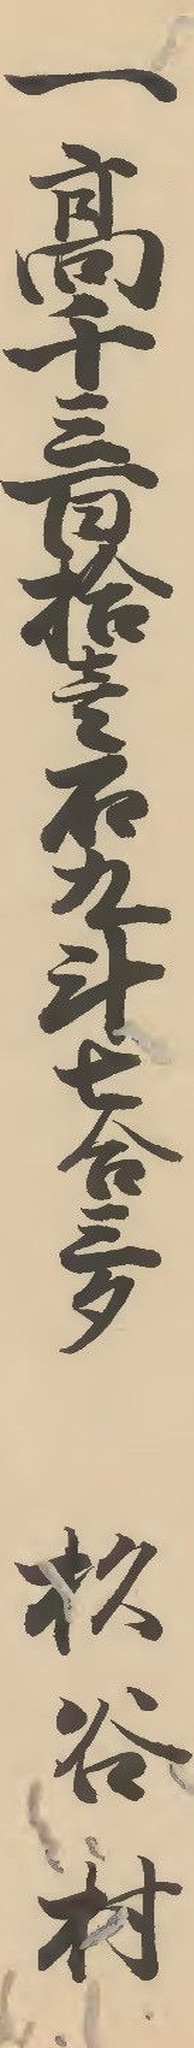一髙千三百拾壱石九斗七合三夕杦谷村
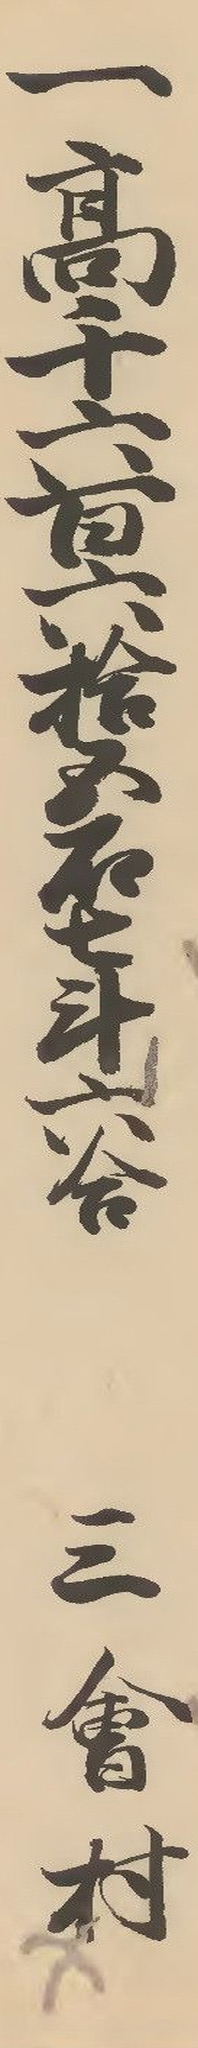一髙千六百六拾五石七斗六合三會村
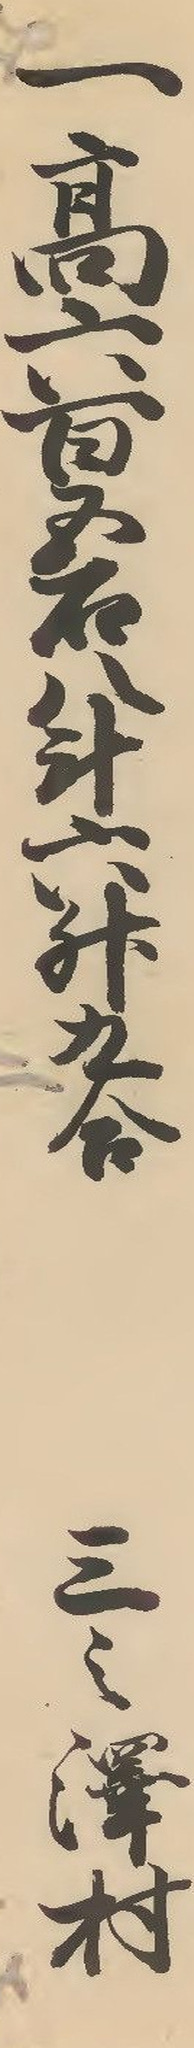一髙六百五石八斗六升九合三之澤村
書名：肥前国郷帳
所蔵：国立公文書館 National Archives of Japan
